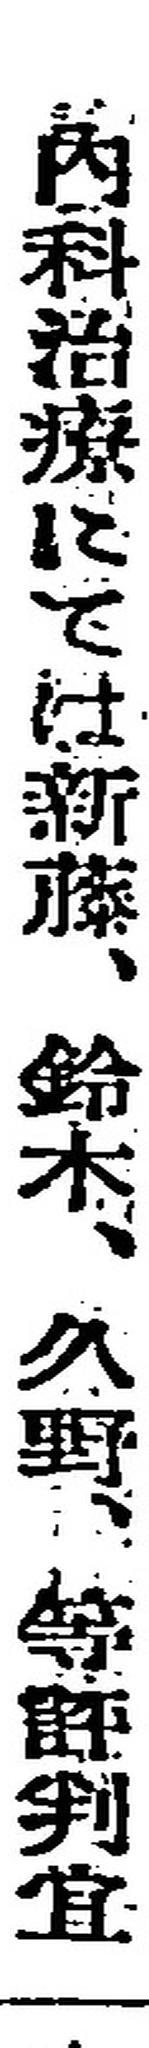内科治療にては新藤、鈴木、久野、等評判宜
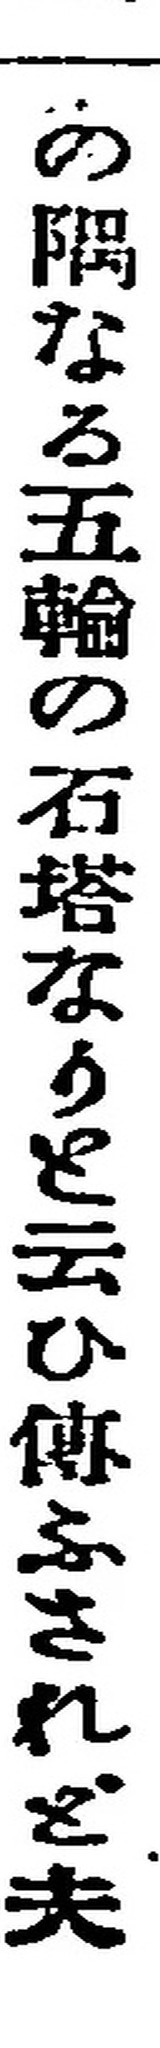の隅なる五輪の石塔なりと云ひ伝ふされど夫
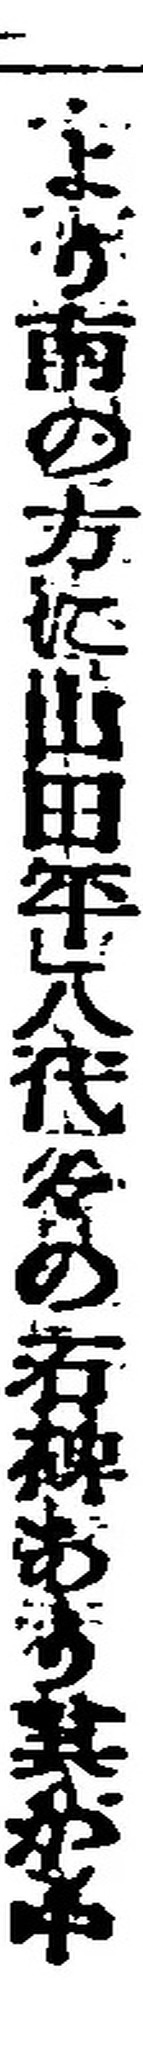より南の方に山田平八代々の石碑あり其が中

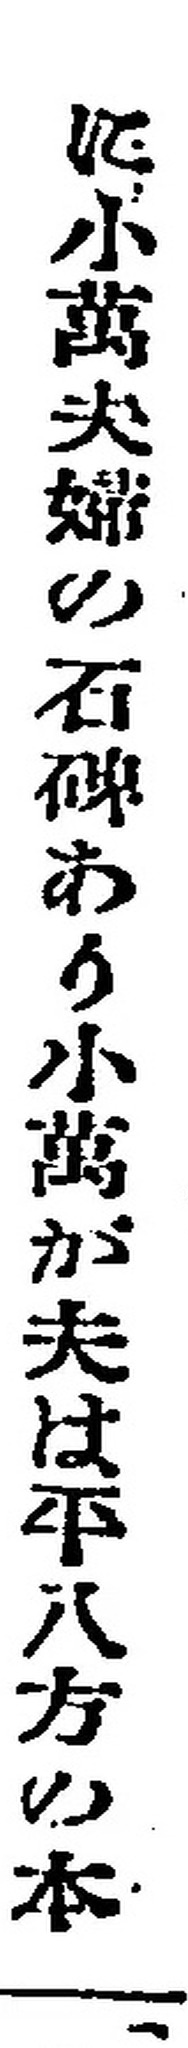に小万夫婦の石碑あり小万が夫は平八方の本
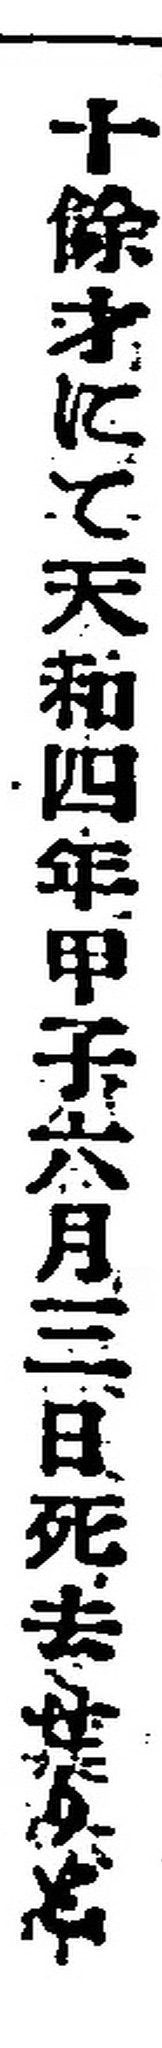十余才にて天和四年甲子六月三日死去せりと
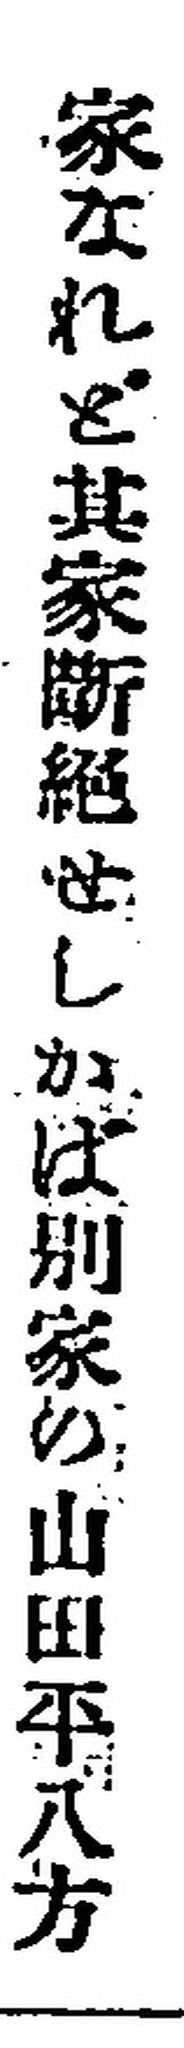家なれど其家断絶せしかば別家の山田平八方
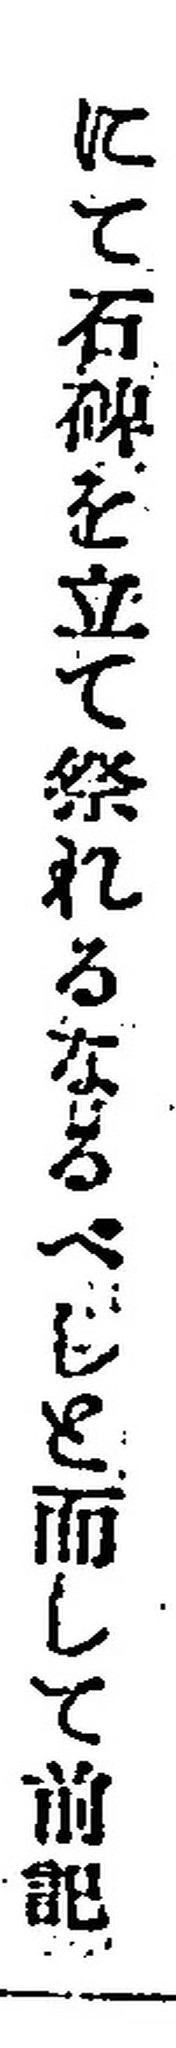にて石碑を立て祭れるなるべしと而して前記
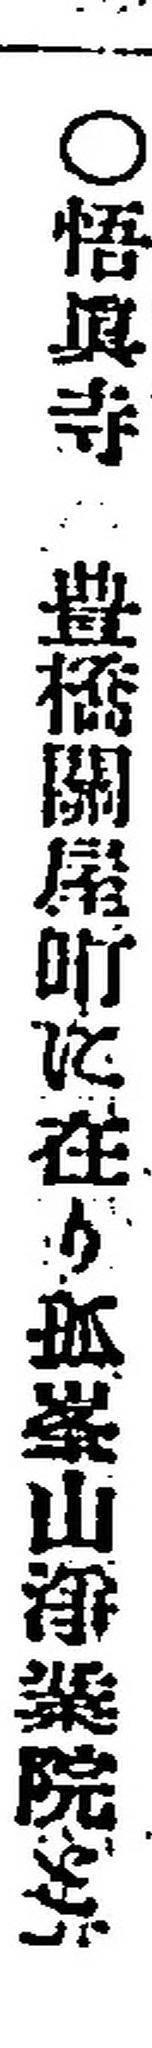○悟真寺豊橋関屋町に在り孤峰山浄業院と
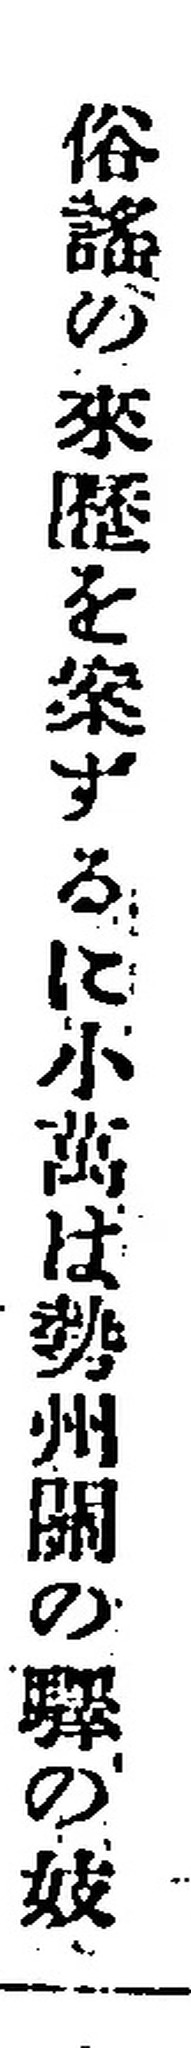俗謡の来歴を案ずるに小万は勢州関の駅の妓
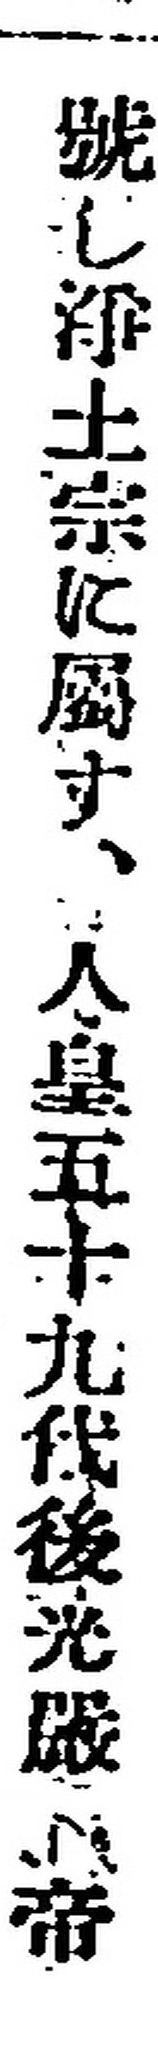号し浄土宗に属す、人皇五十九代後光厳帝
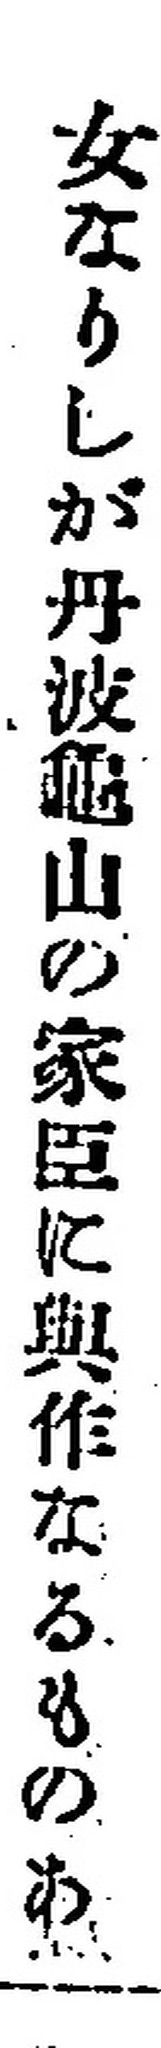女なりしが丹波亀山の家臣に与作なるものあ
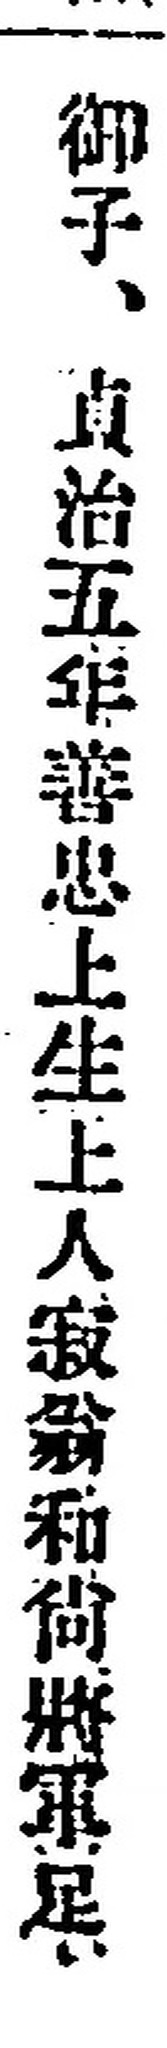御子、貞治五年善忠上生上人寂翁和尚将軍足
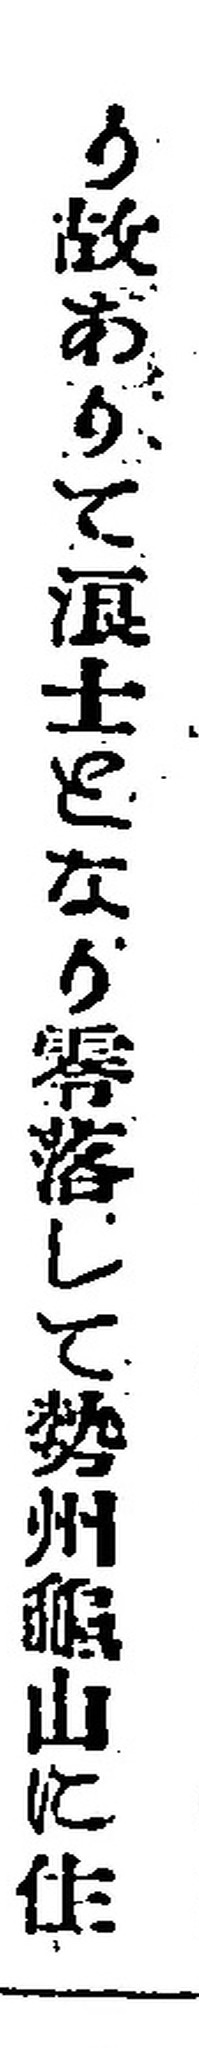り故ありて浪士となり零落して勢州亀山に住
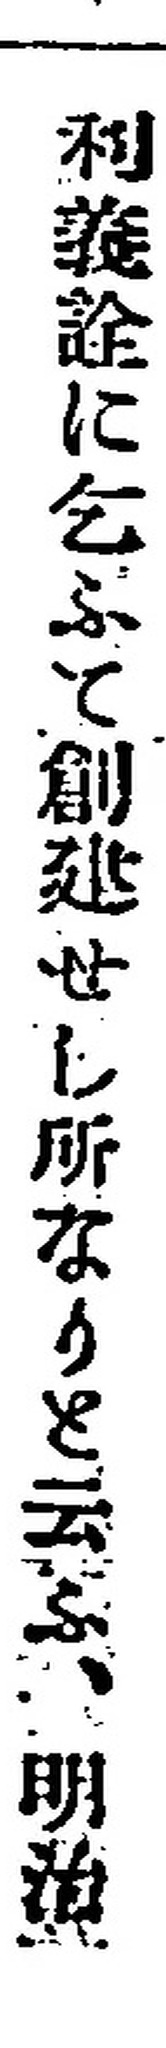利義詮に乞ふて創建せし所なりと云ふ、明治
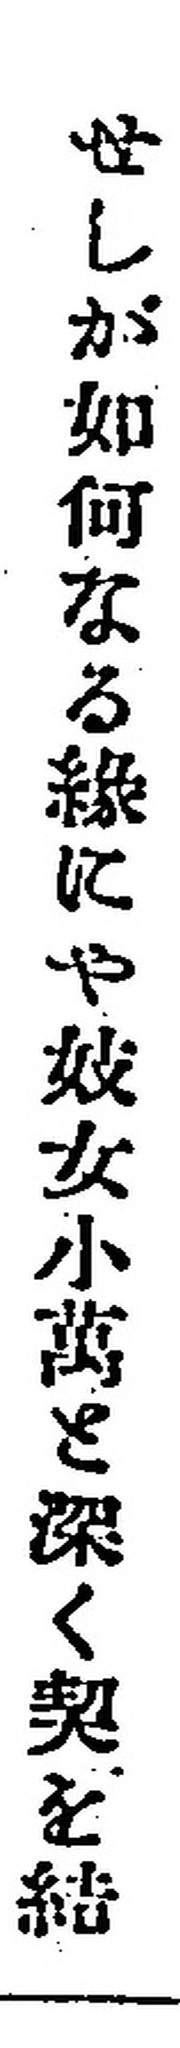せしが如何なる縁にや妓女小万と深く契を結
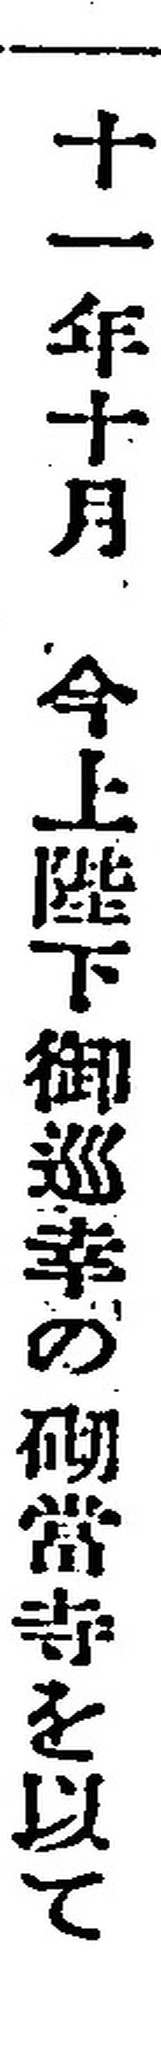十一年十月今上陛下御巡幸の砌当寺を以て
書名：東参名勝案内
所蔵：国立国会図書館 National Diet Library, JAPAN
